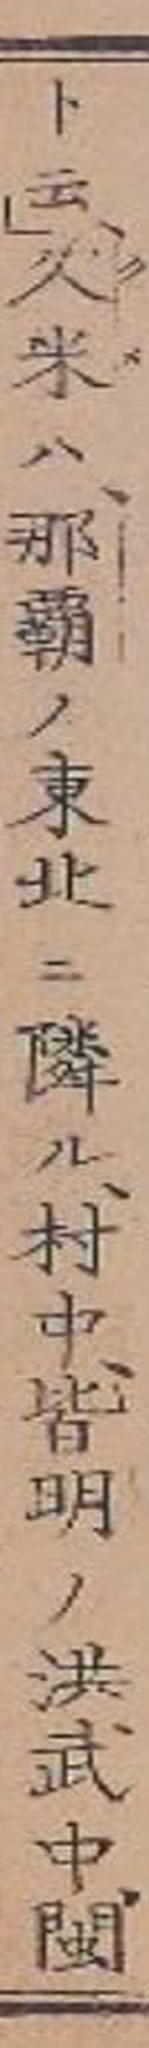ト云、」久米ハ、那覇ノ東北ニ隣ル、村中、皆明ノ洪武中、閩

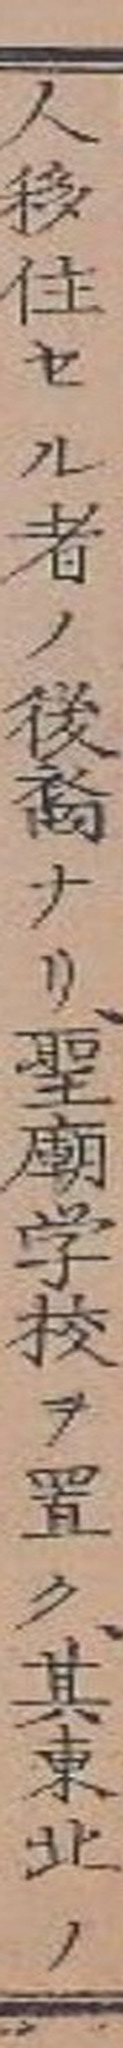人移住セル者ノ後裔ナリ、聖廟学校ヲ置ク、其東北ノ
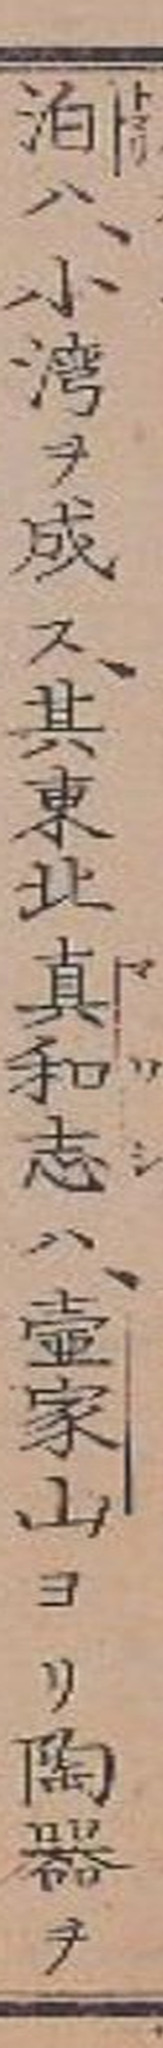泊ハ、小湾ヲ成ス、其東北真和志ハ、壺家山ヨリ陶器ヲ
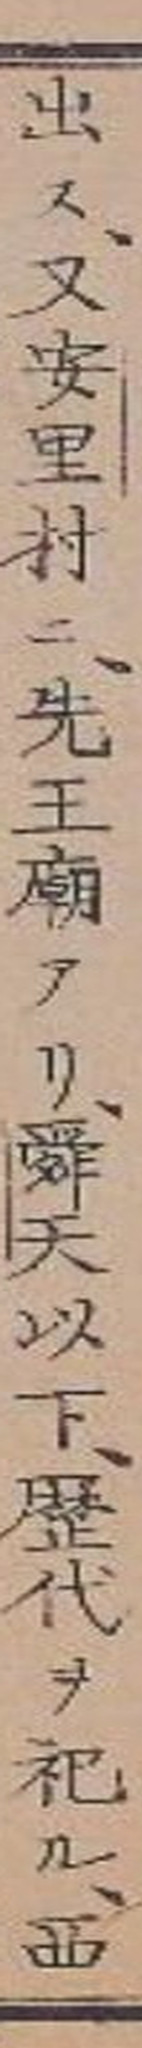出ス、又安里村ニ、先王廟アリ、舜天以下、歴代ヲ祀ル、西
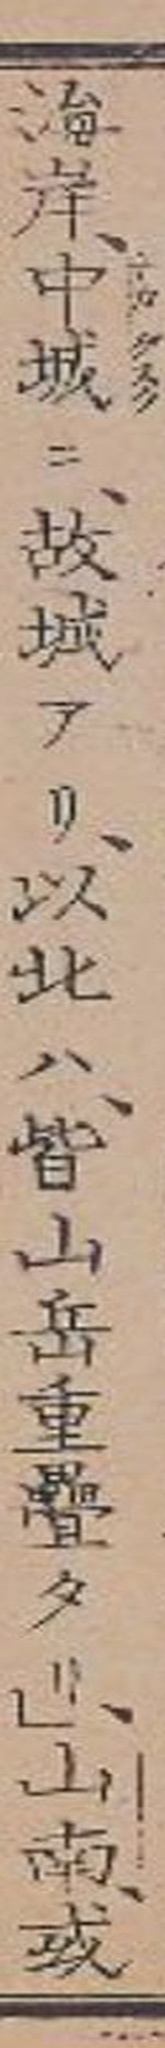海岸、中城ニ、故城アリ、以北ハ、皆山岳重畳タリ、」山南、或
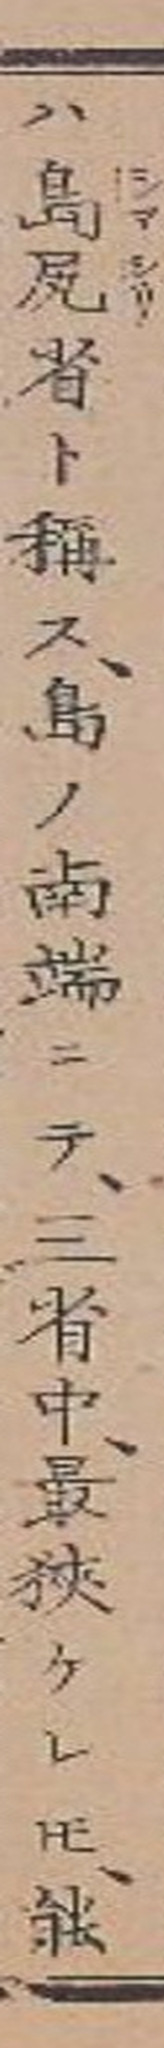ハ島尻省ト称ス、島ノ南端ニテ、三省中、最狭ケレトモ、能
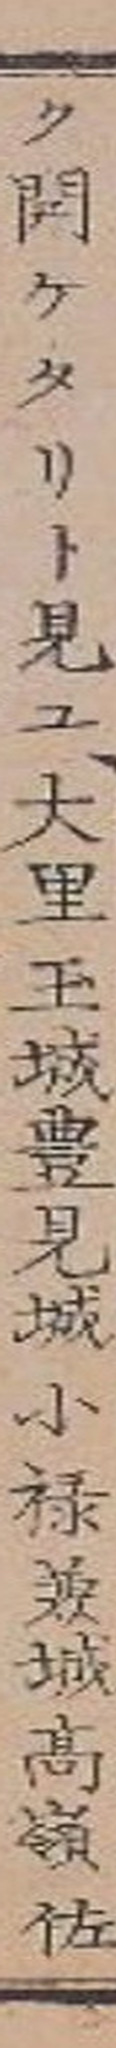ク開ケタリト見ユ、大里玉城豊見城小禄兼城高嶺佐
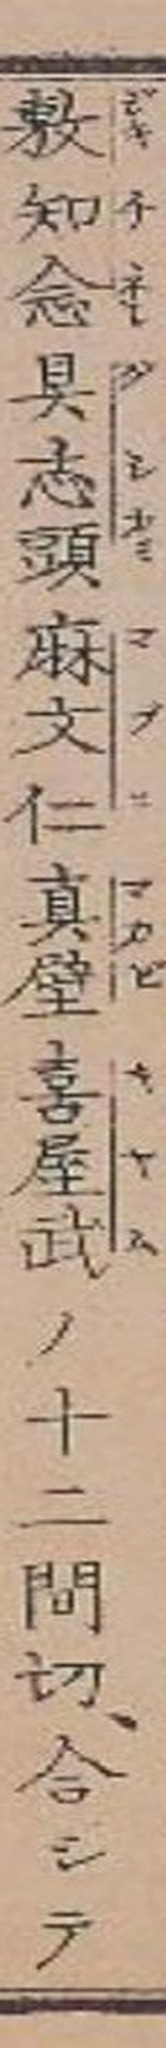敷知念具志頭麻文仁真壁喜屋武ノ十二間切、合シテ
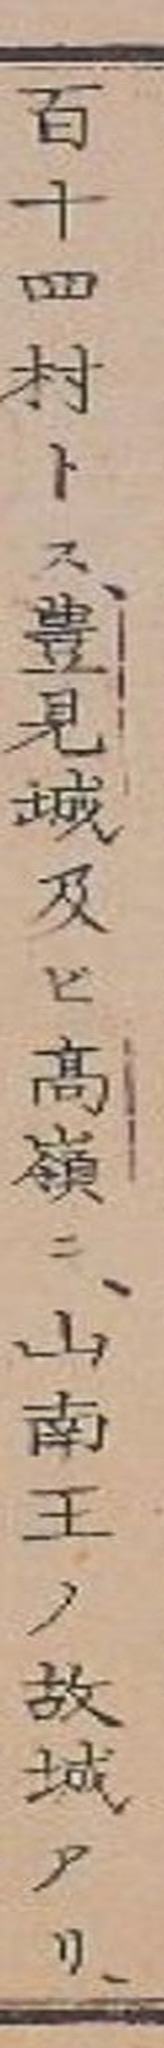百十四村トス、豊見城及ビ高嶺ニ、山南王ノ故城アリ、
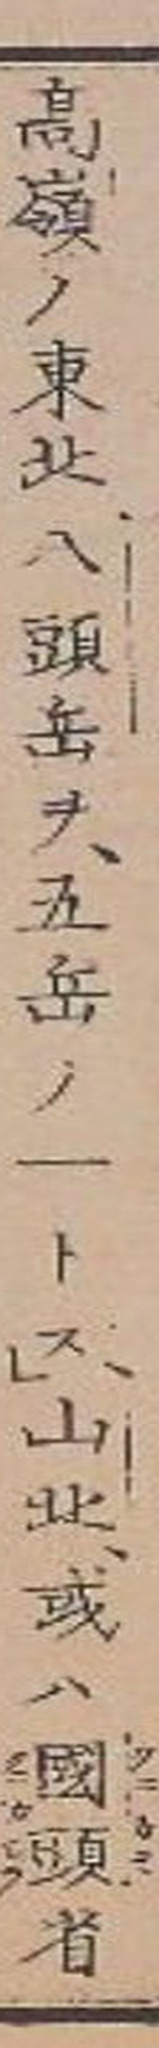高嶺ノ東北八頭岳ヲ、五岳ノ一トス、」山北、或ハ国頭省
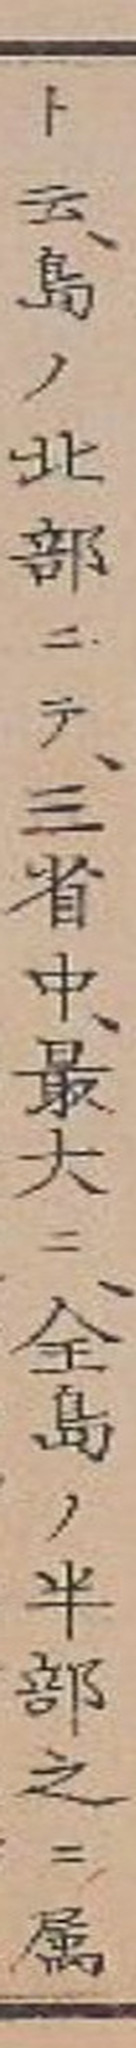ト云、島ノ北部ニテ、三省中、最大ニ、全島ノ半部之ニ属
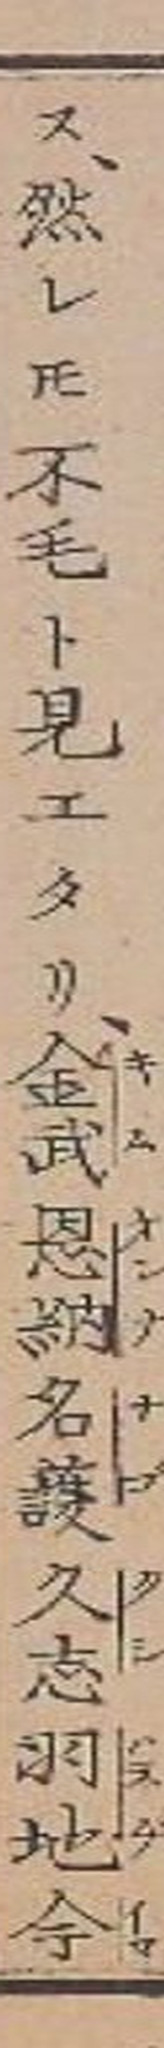ス、然レトモ不毛ト見エタリ、金武恩納名護久志羽地今
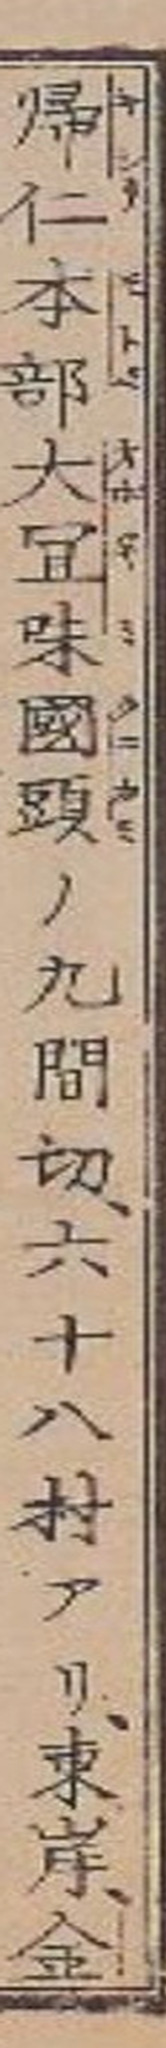帰仁本部大宜味国頭ノ九間切、六十八村アリ、東岸、金
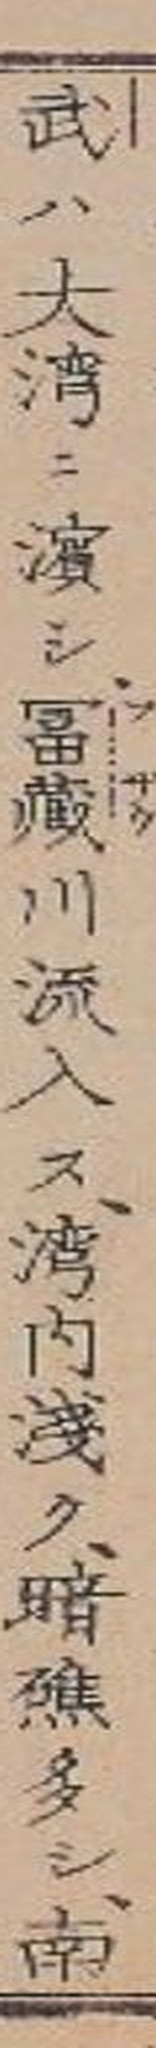武ハ大湾ニ浜シ、富蔵川流入ス、湾内浅ク、暗礁多シ、南
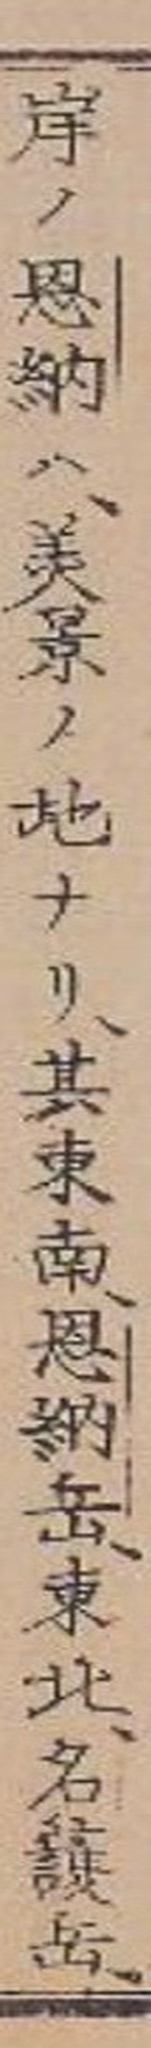岸ノ恩納ハ、美景ノ地ナリ、其東南、恩納岳、東北、名護岳、
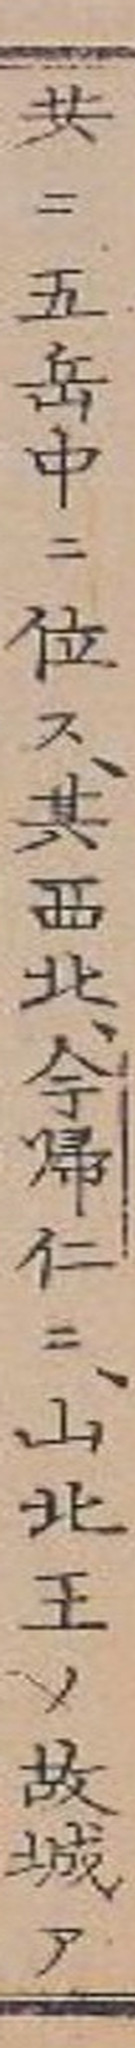共ニ五岳中ニ位ス、其西北、今帰仁ニ、山北王ノ故城ア
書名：琉球新誌 巻上
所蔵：University of the Ryukyus Library
